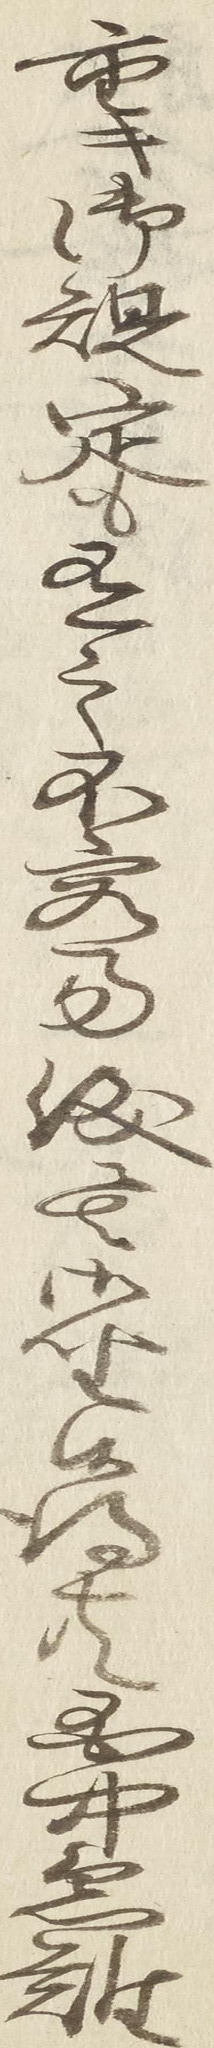重き御規定も有之不容易儀には御座候得共国中急難
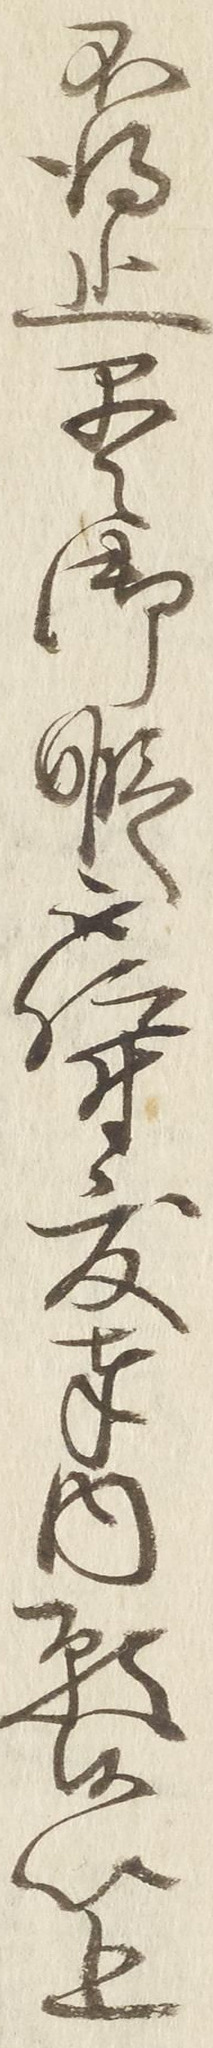不得止早々御暇被仰付度奉内願候以上
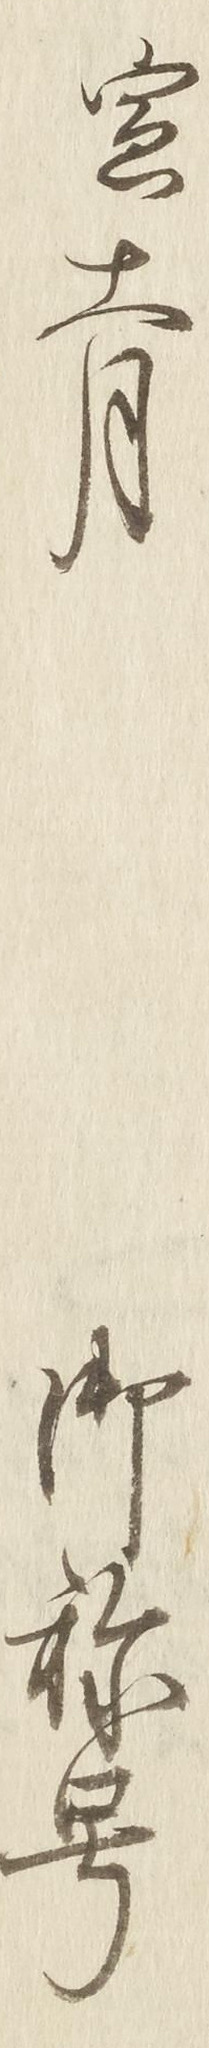寅十一月御称号
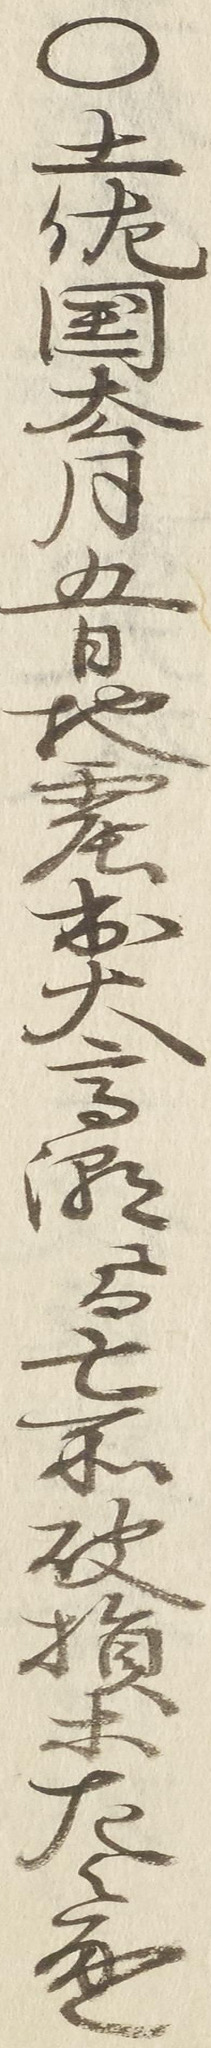〇土佐国去月五日地震出火高潮にて亡所破損等左之通

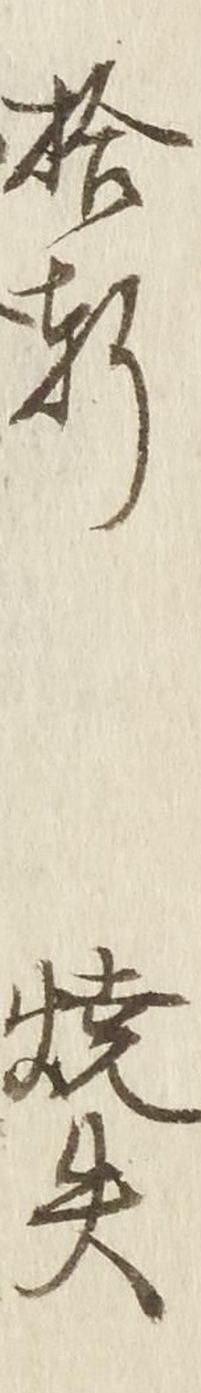拾軒焼失
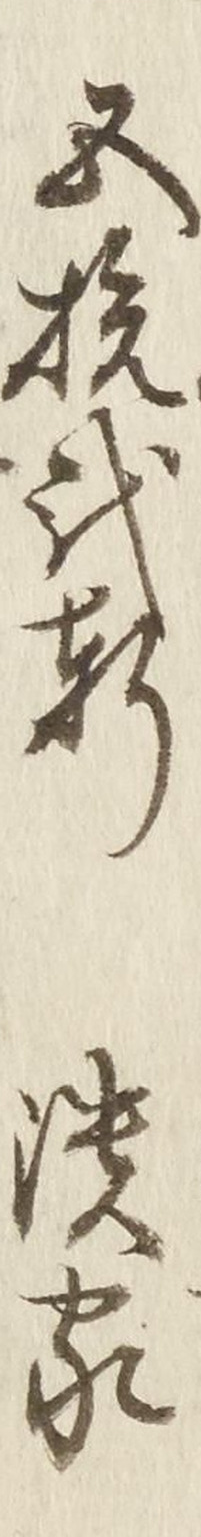五拾二軒潰家
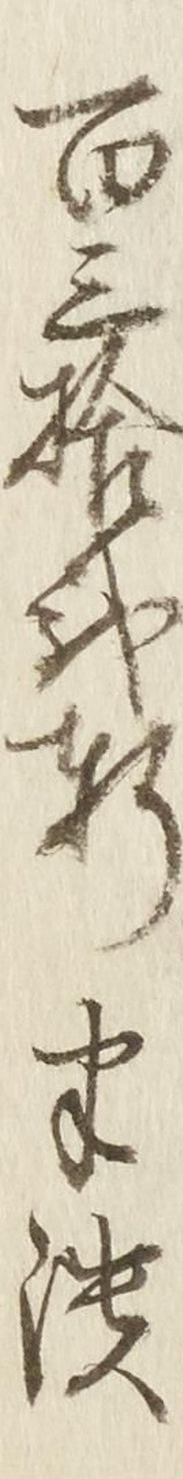百三拾弐軒半潰
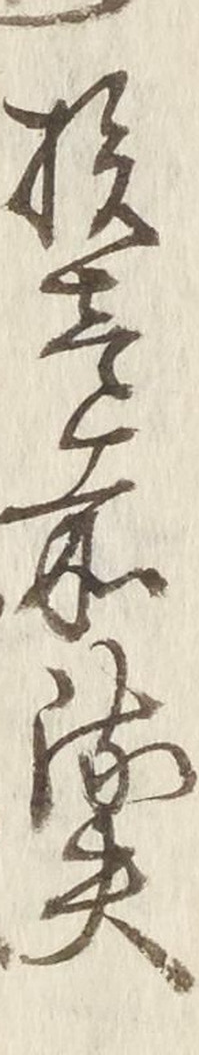内壱ヶ所流失
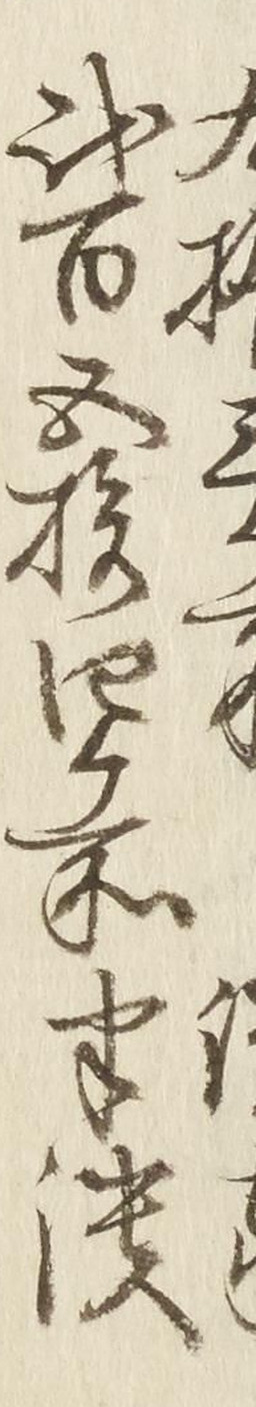弐百五拾四ヶ所半潰
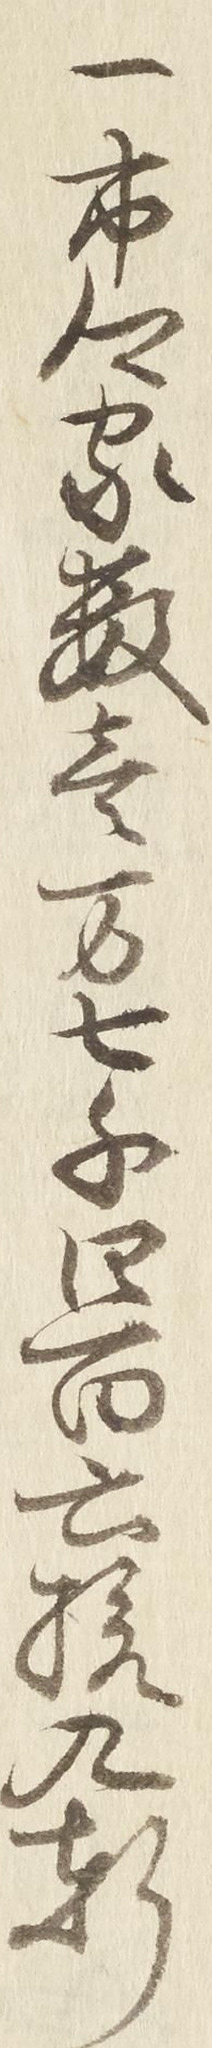一市郷家数壱万七千四百六拾九軒
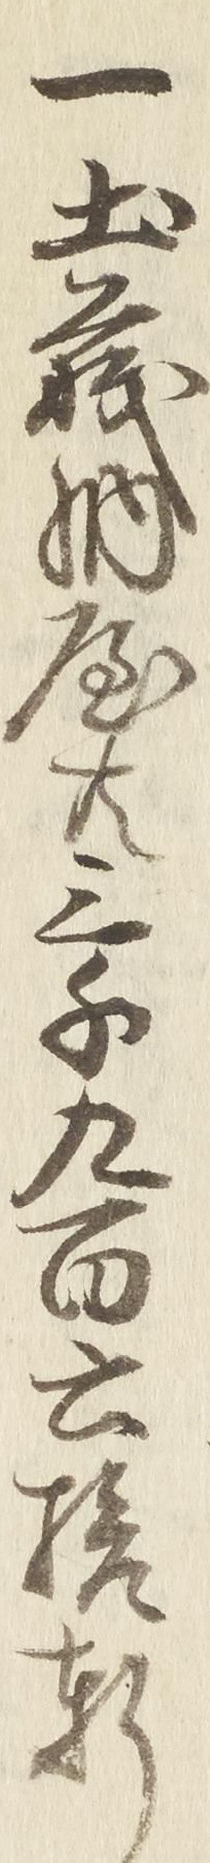一土蔵納屋共三千九百六拾軒
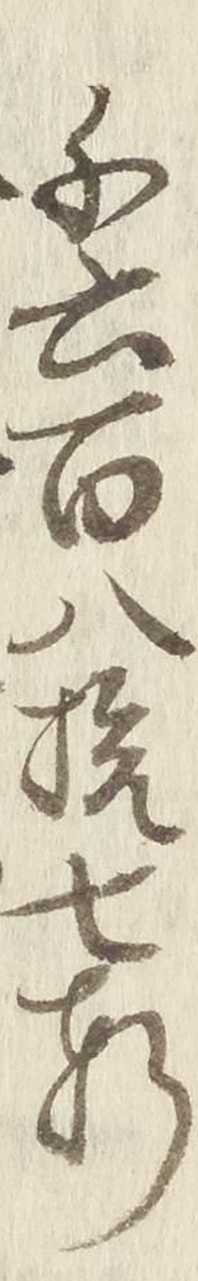千六百八拾七軒潰家
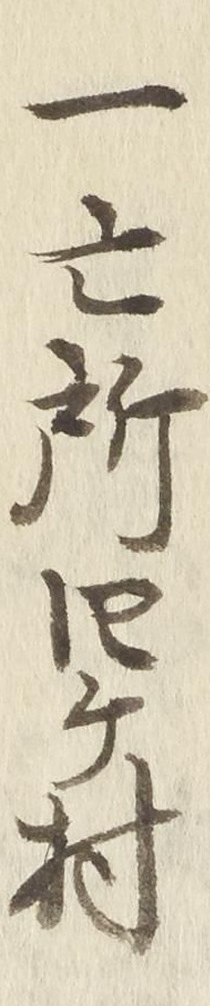一亡所四ヶ村
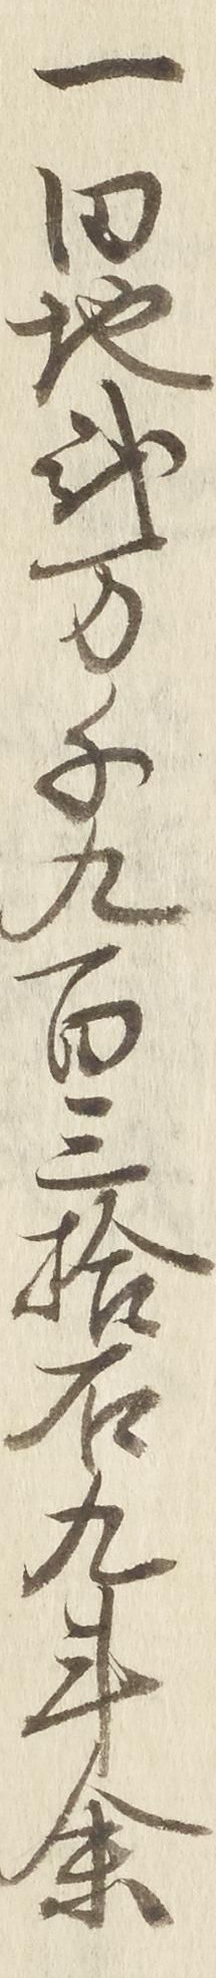一田地弐万千九百三拾石九斗余
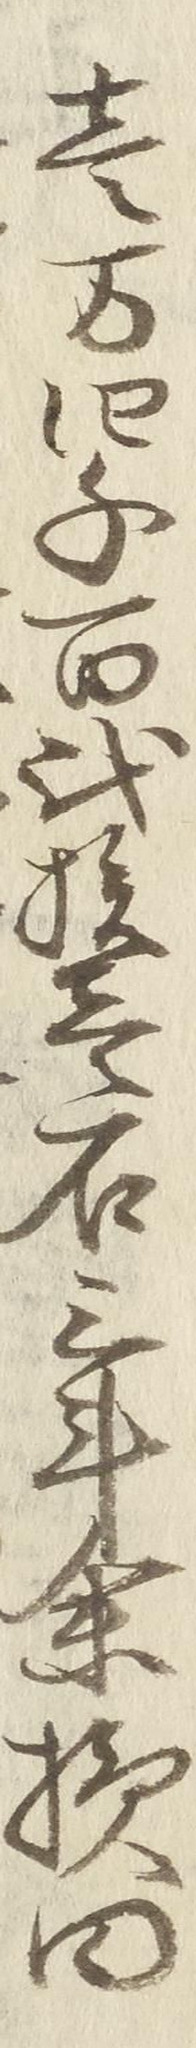内壱万四千百弐拾壱石参斗余損田
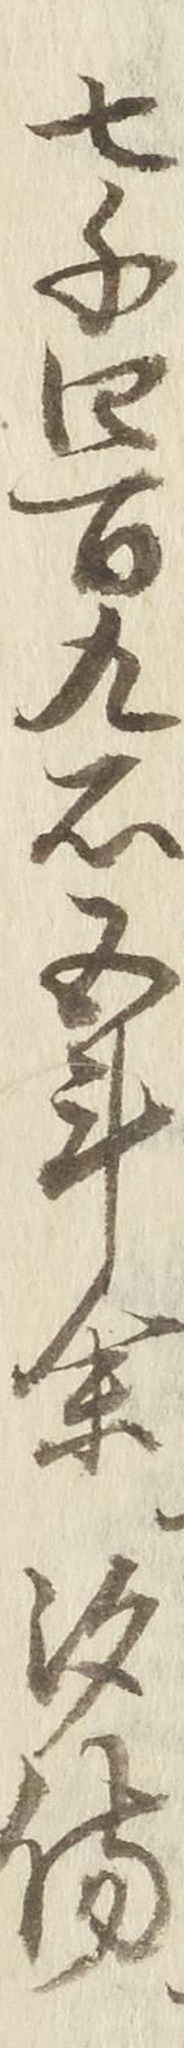七千四百九石五斗余汐備
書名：地震記　上
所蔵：東京大学地震研究所図書室 Earthquake Research Institute Library, The University of Tokyo, JAPAN
